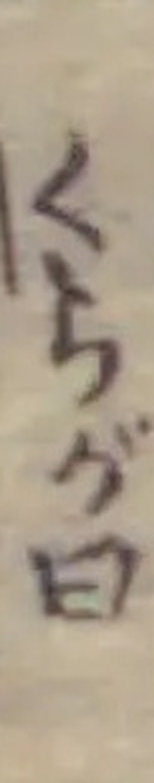くちが曰
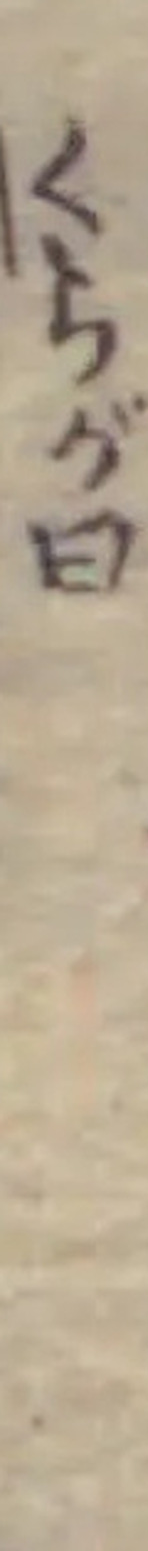くちが曰
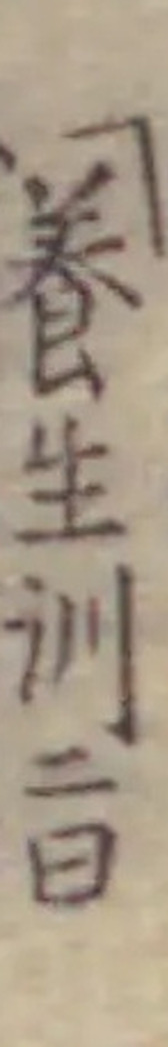〽養生訓に曰
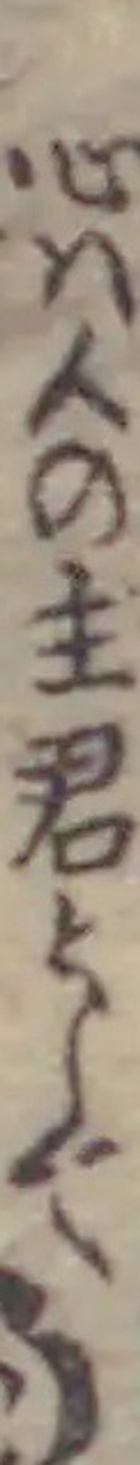心は人の主君として
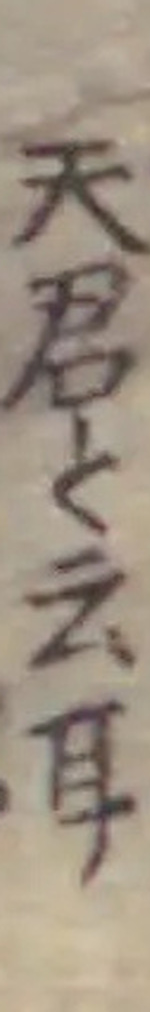天君と云耳
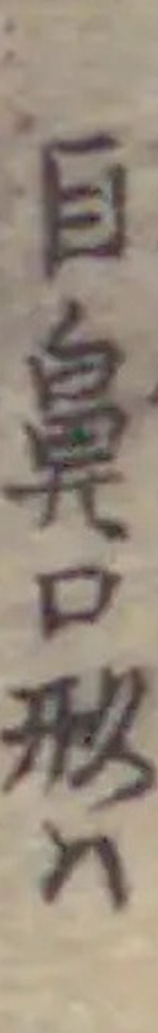目鼻口形は
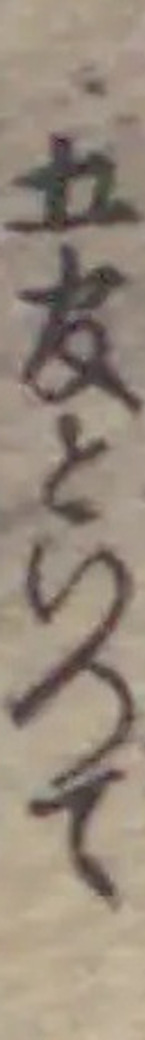五友といつて
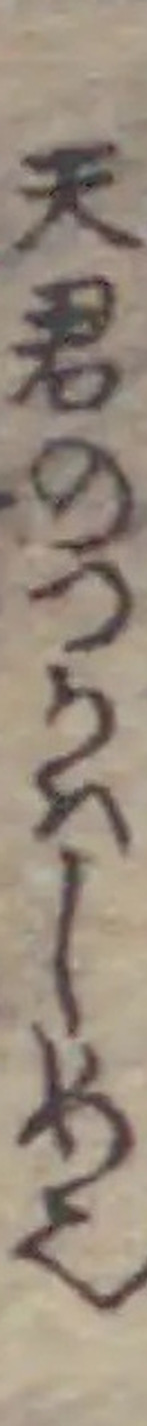天君のつかはしめ也
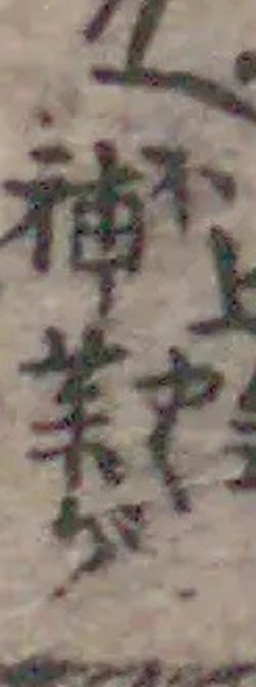補薬が
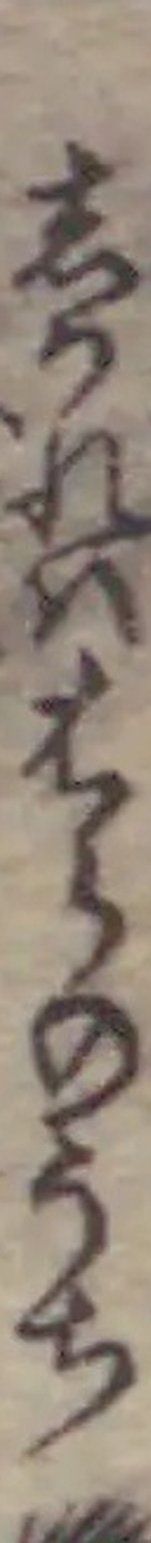しかれははらのうち
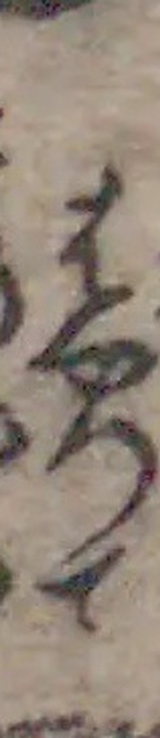はやつて
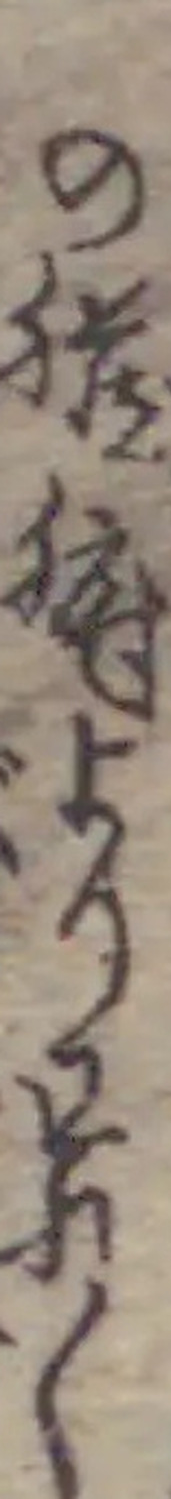の臓腑よりわれ〳〵
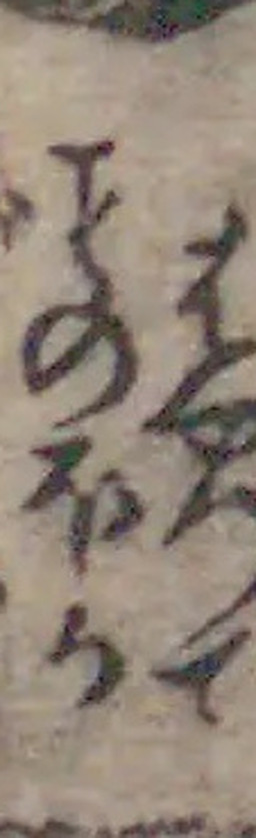ことのほか
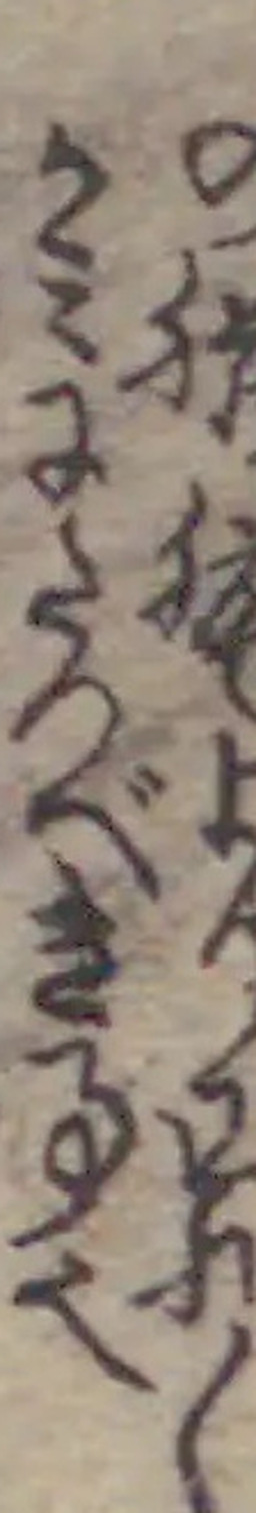かみにたつべき事也
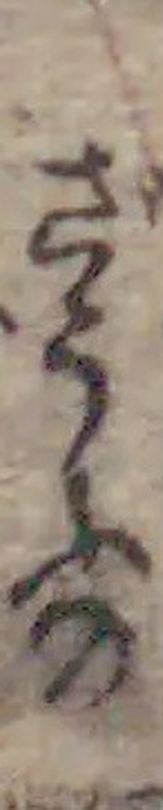ざうふの
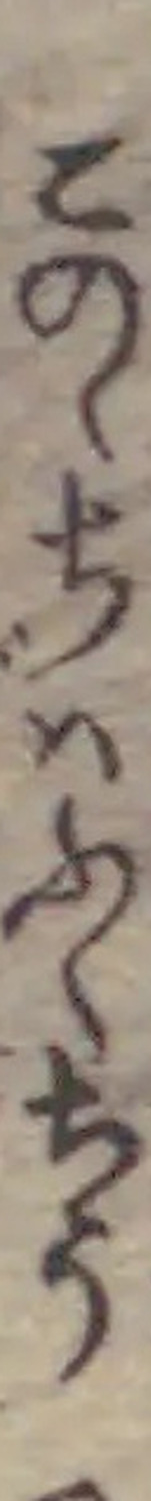このゝちはふくちう
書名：腹内養生主論 3巻
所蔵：国立国会図書館 National Diet Library, JAPAN
